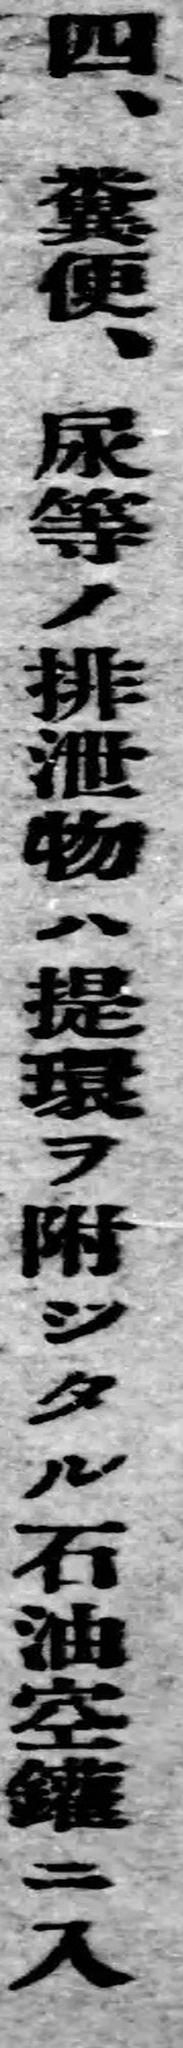四、糞便、尿等ノ排泄物ハ提環ヲ附シタル石油空鑵ニ入
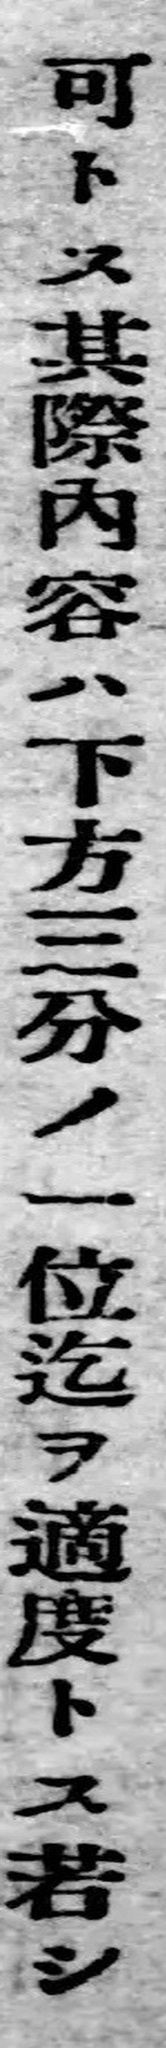可トス其際内容ハ下方三分ノ一位迄ヲ適度トス若シ
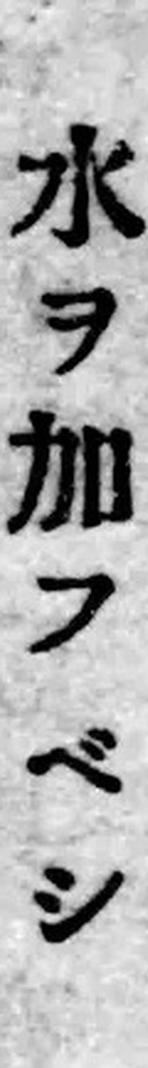水ヲ加フベシ
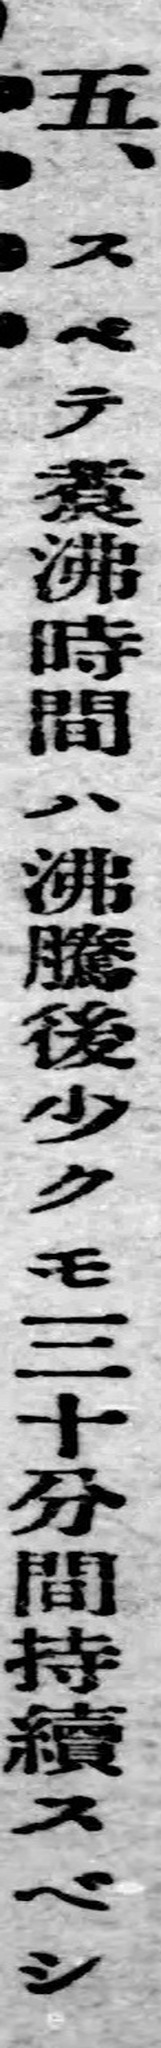五、スベテ煑沸時間ハ沸騰後少クモ三十分間持續スベシ
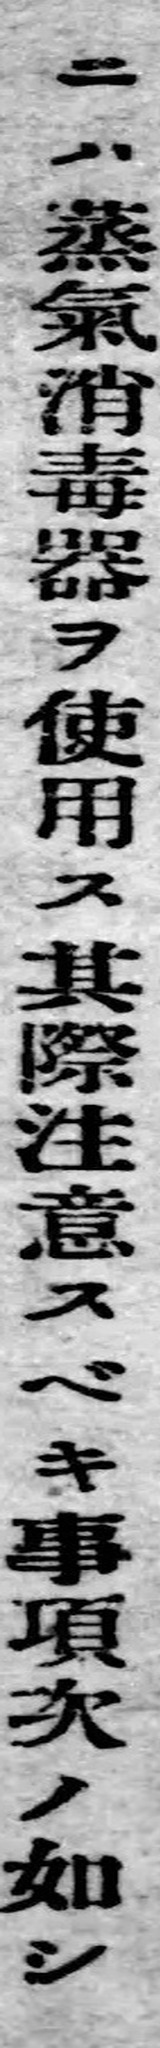ニハ蒸氣消毒器ヲ使用ス其際注意スベキ事項次ノ如シ
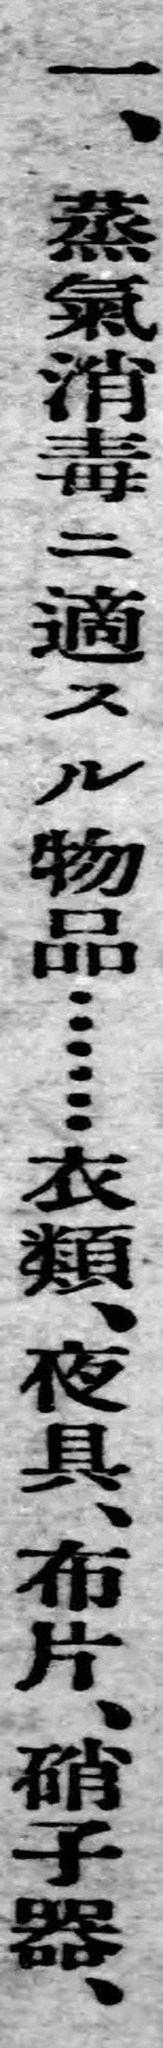一、蒸氣消毒ニ適スル物品……衣類、夜具、布片、硝子器、
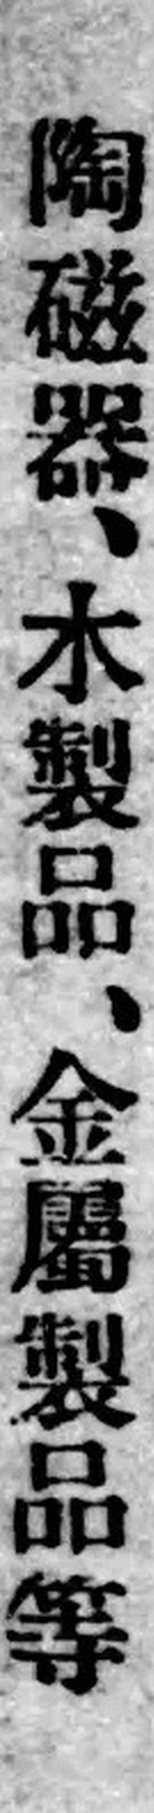陶磁器、木製品、金屬製品等
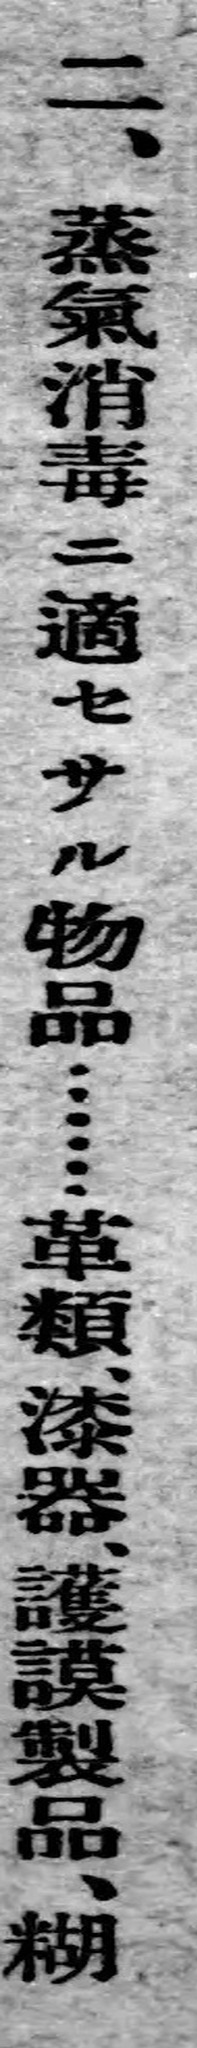二、蒸氣消毒ニ滴セサル物品……革類、漆器、護謨製品、糊
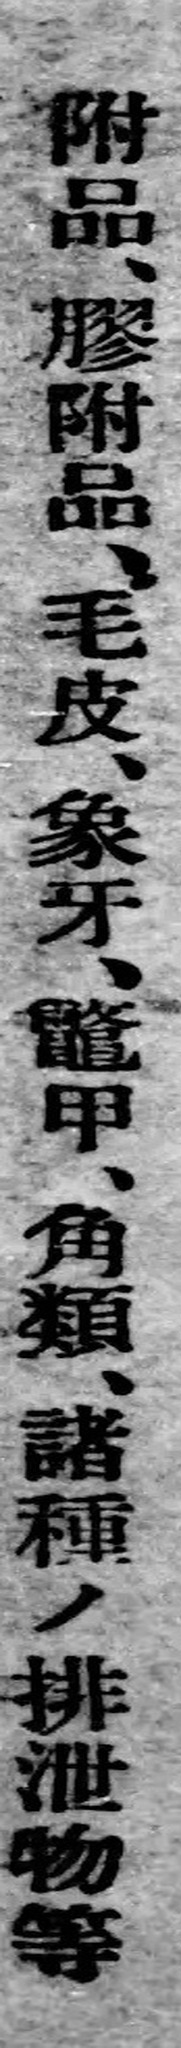附品、膠附品、毛皮、象牙、鼈甲、角類、諸種ノ排泄物等
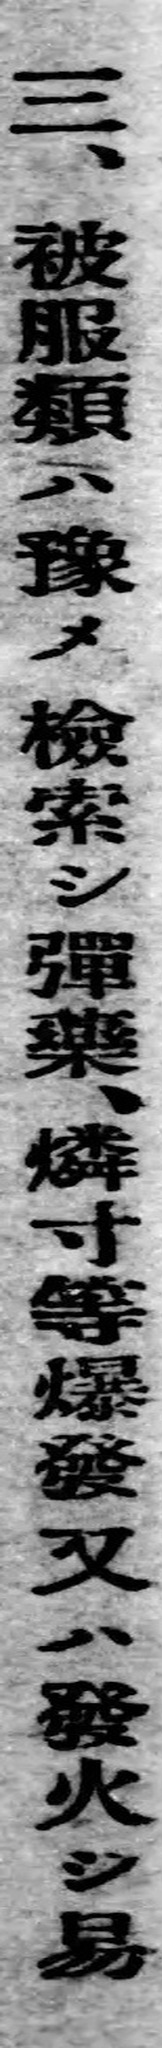三、被服類ハ豫メ檢索シ彈藥、燐寸等爆發又ハ發火シ易
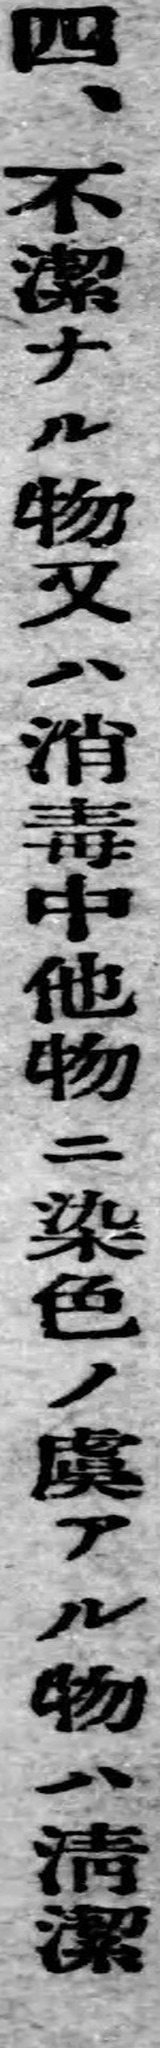四、不潔ナル物又ハ消毒中他物ニ染色ノ虞アル物ハ淸潔
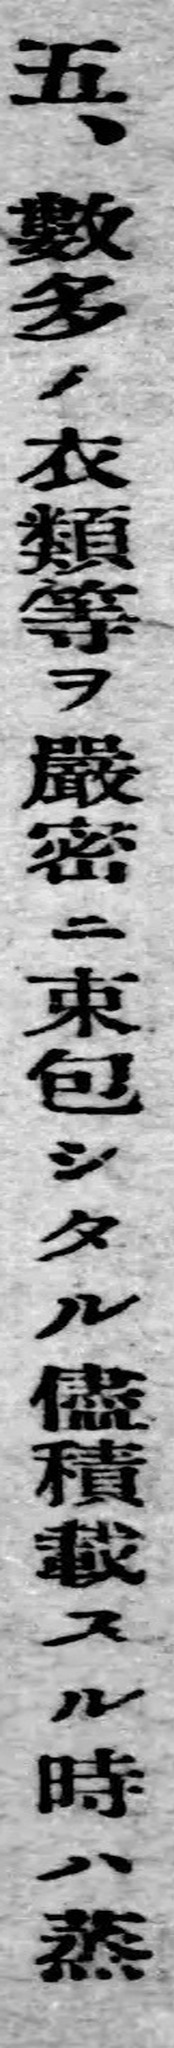五、數多ノ衣類等ヲ嚴密ニ束包シタル儘積載スル時ハ蒸
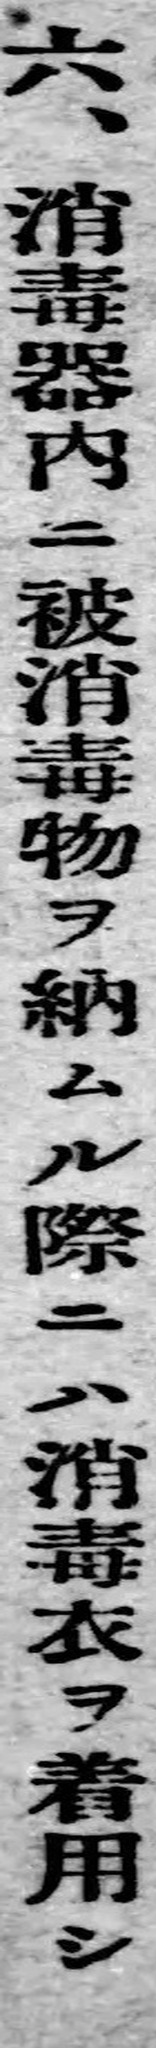六、消毒器内ニ被消毒物ヲ納ムル際ニハ消毒衣ヲ着用シ

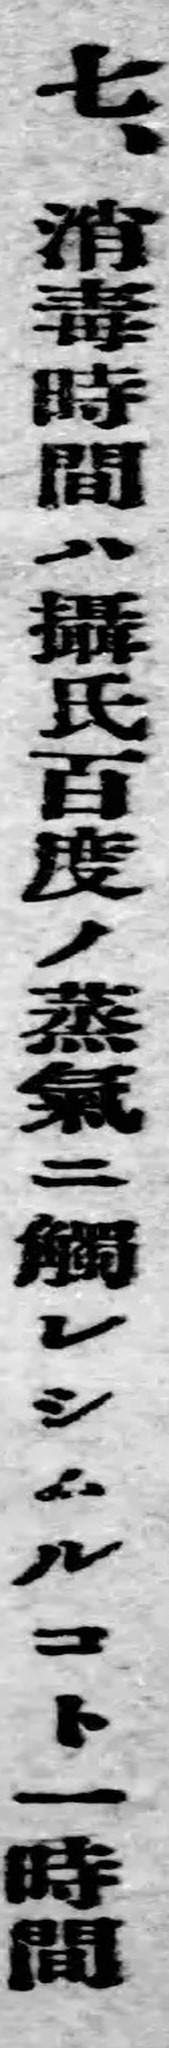七、消毒時間ハ攝氏百度ノ蒸氣ニ觸レシムルコト一時間
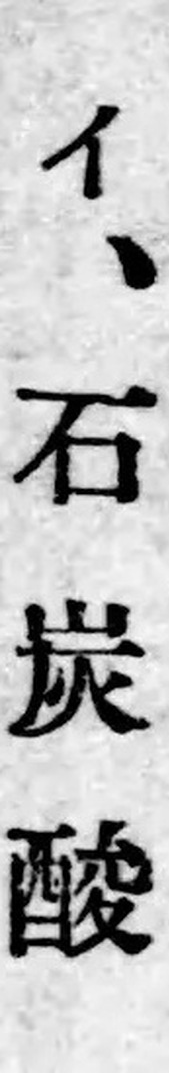イ、石炭酸
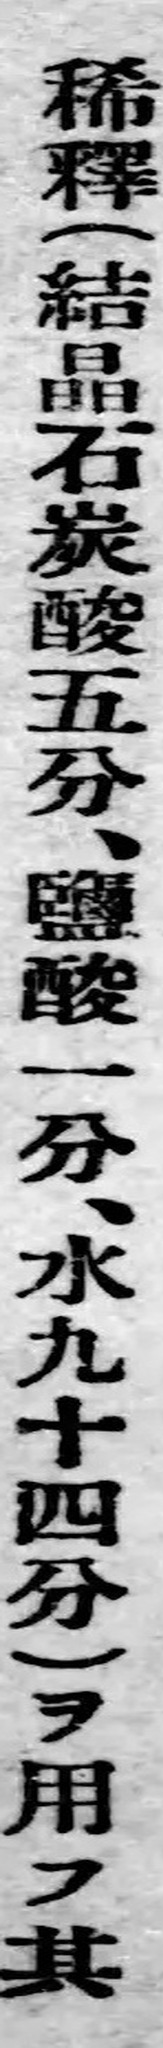稀釋(結晶石炭酸五分、鹽酸一分、水九十四分)ヲ用フ其
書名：袖珍防疫必携
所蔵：国立国会図書館 National Diet Library, JAPAN
